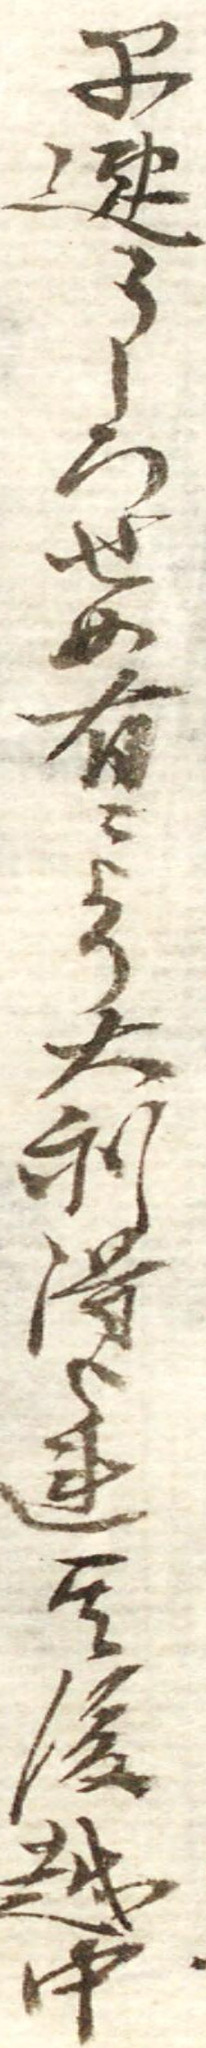早速うしろせめ有により大利得ら連其後越中
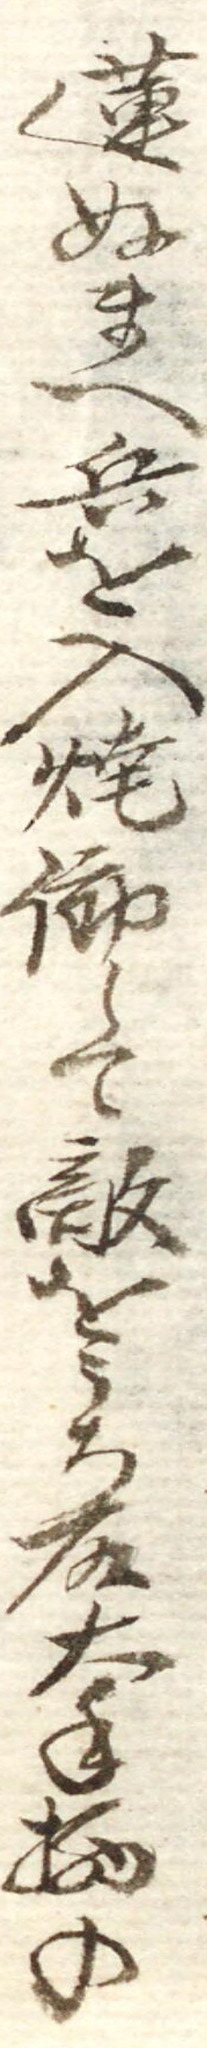蓮ぬまへ兵を入焼働して敵をうち故大手柄の
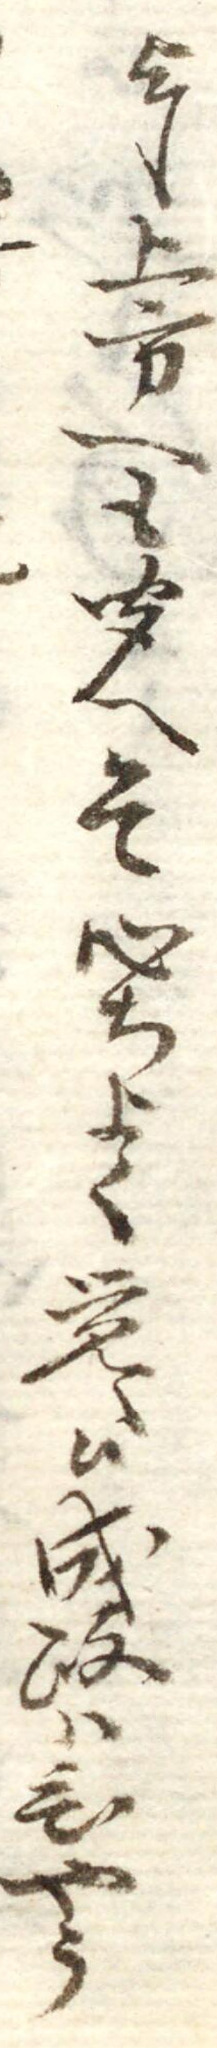与し上方へも聞へ候て心ちよく覚へ候成政は飛やう
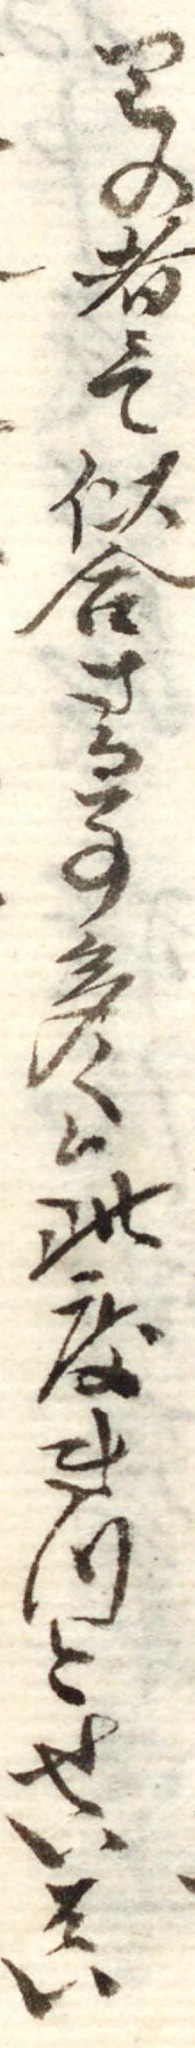里の者にて似合さる事多く候此度き川とせいはい
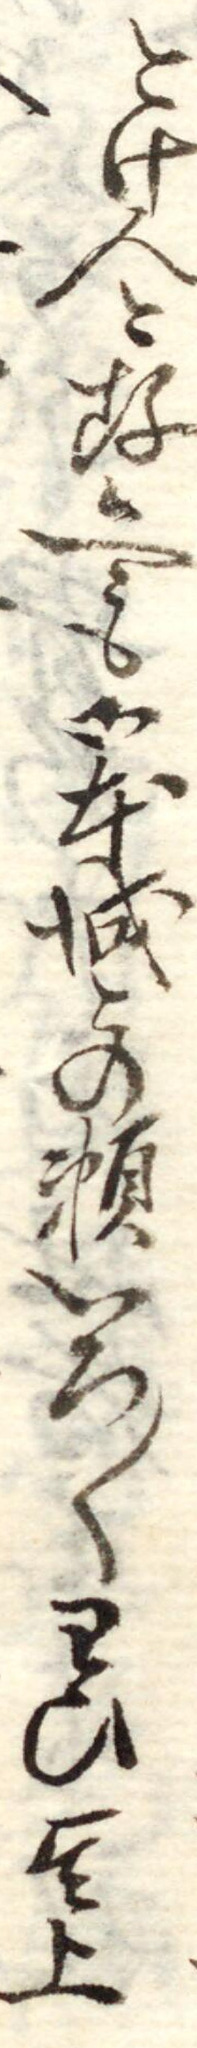とけんと存候へとも御本城との頼いろ〳〵已ひ其上
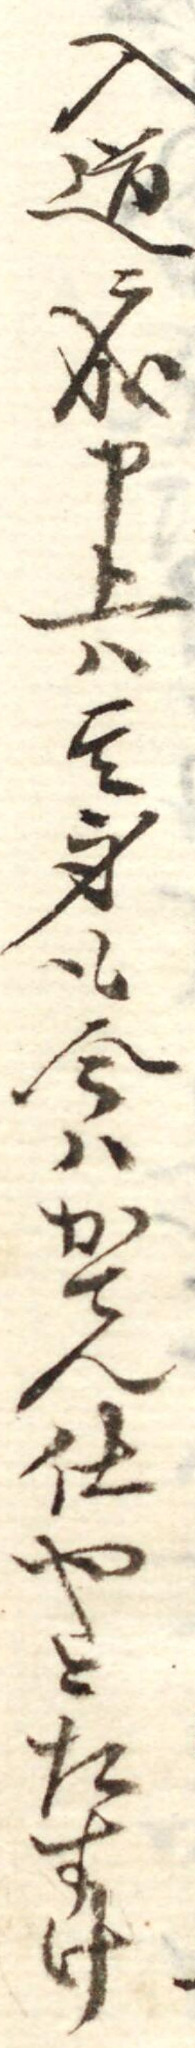入道に成申上は其身も今はかてん仕やとたすけ
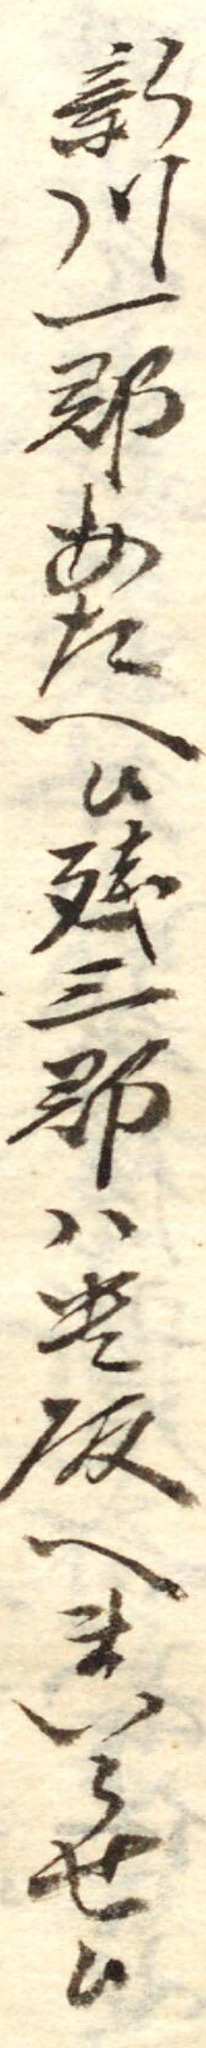新川一郡あたへ候残三郡は貴殿へまいらせ候
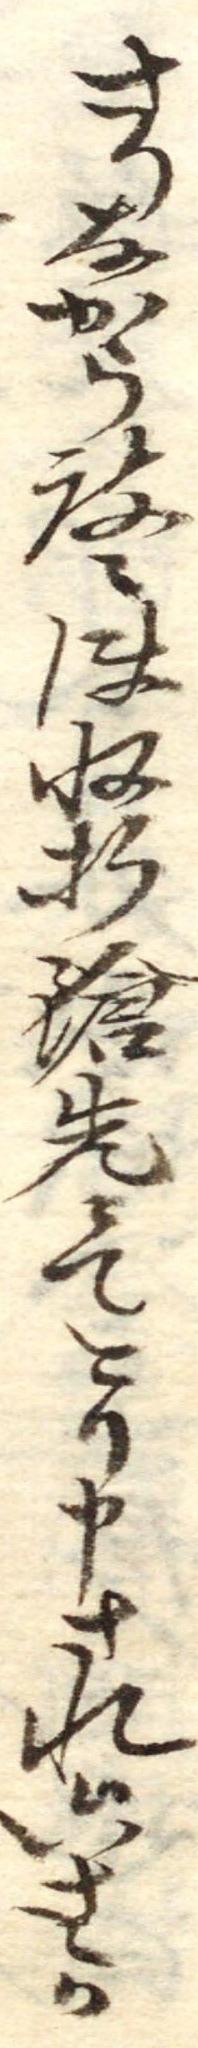さりなから度々ほね折鎗先にてとり申されはいさゝか
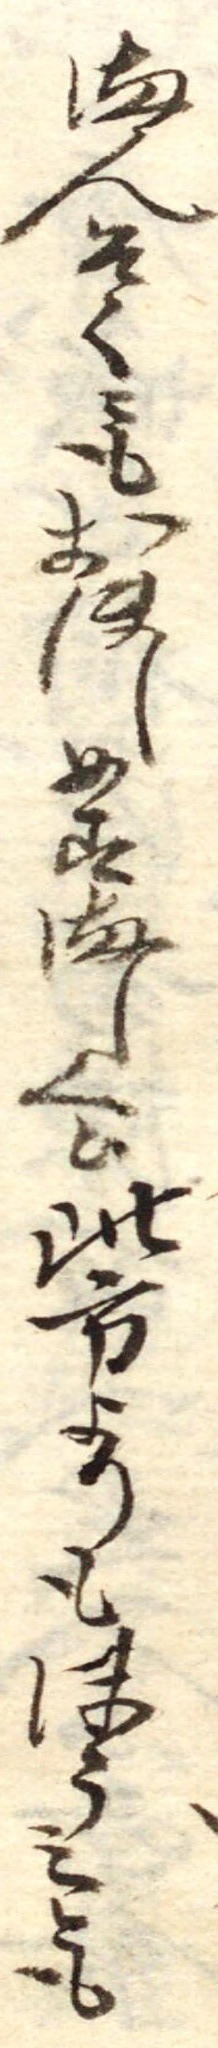満んそくにもおほしめ春満しく候此方よりもほうみとも
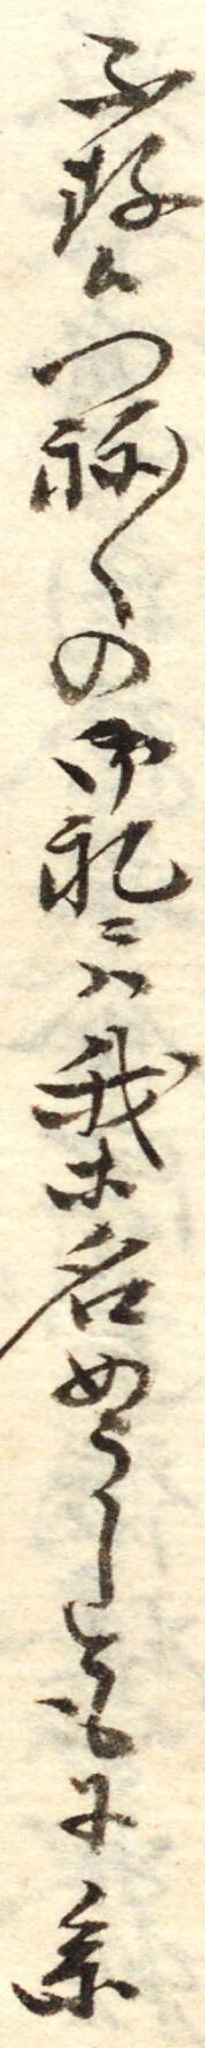ふ存候つ祢〳〵の御礼には我等名めうしとも尓参
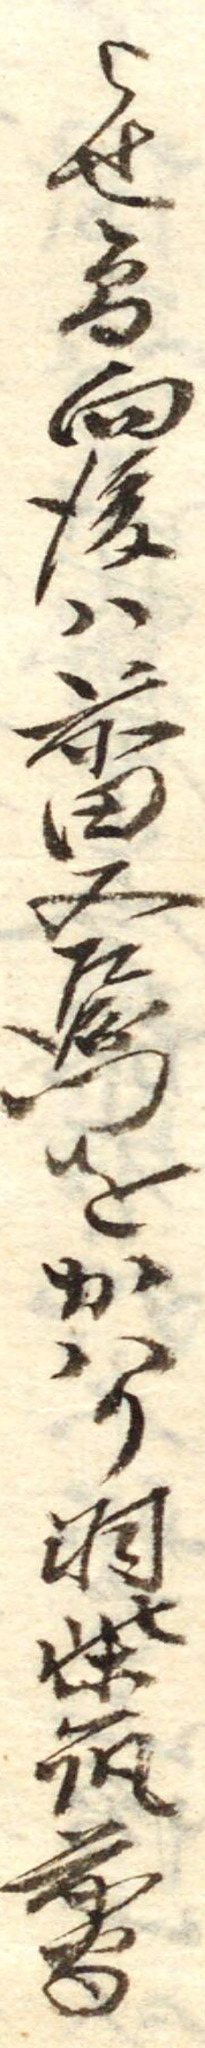らせ候間向後は前田又左衛門をかはり羽柴筑前守
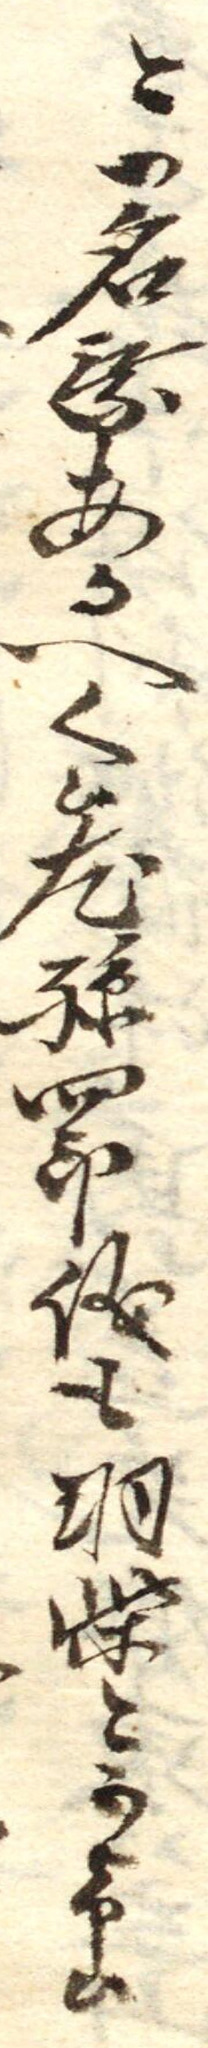と御名乗あるへく候尤孫四郎儀も羽柴と可被申候
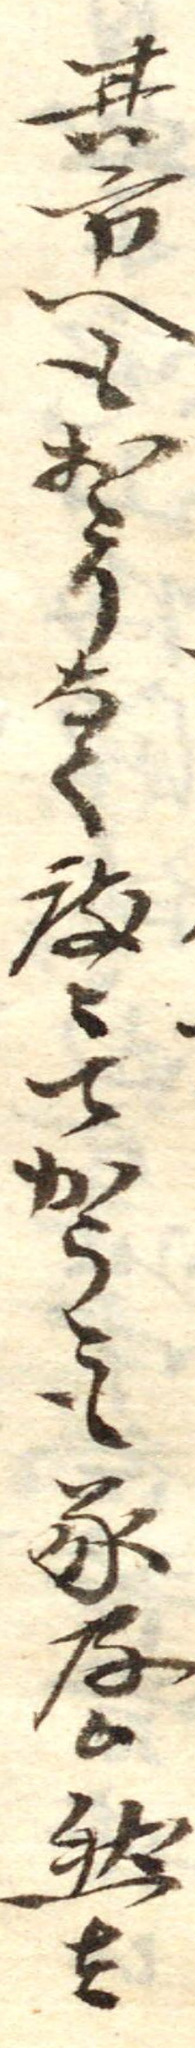其方へもおとりなく度々てからとも承及候然者
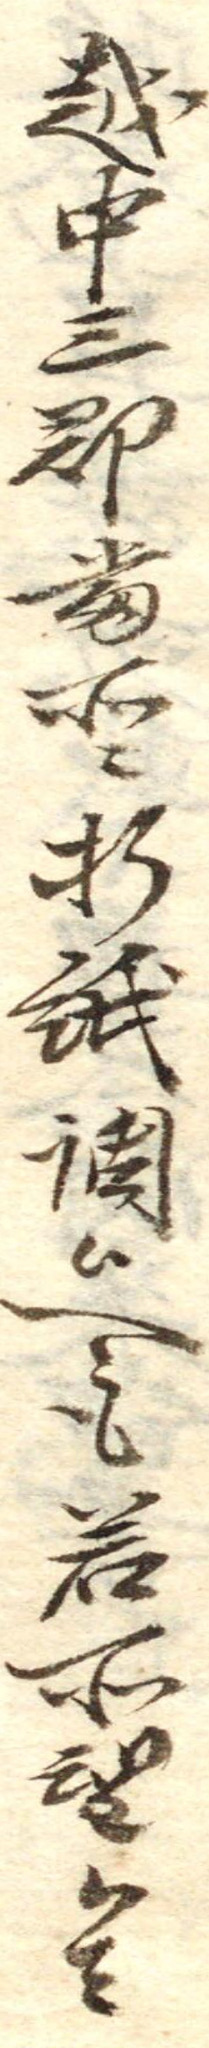越中三郡番所に折紙調候へとも若所望候者
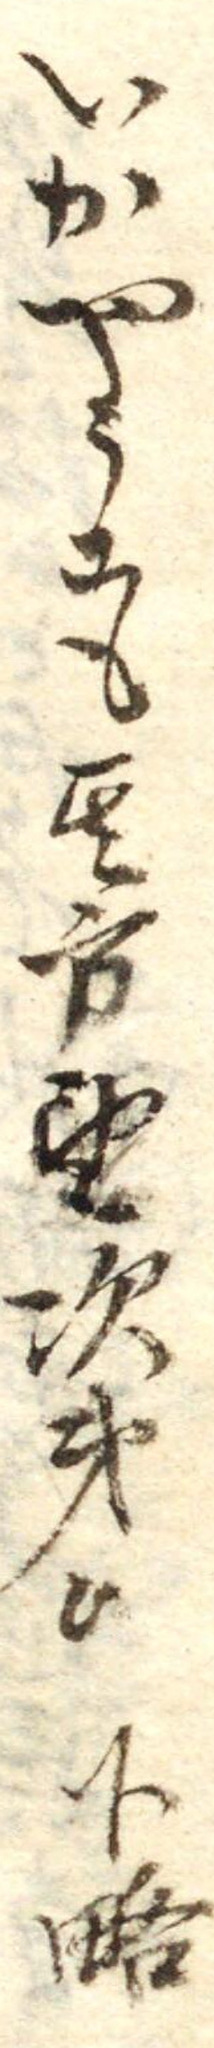いかやうにも其方望次第候下略
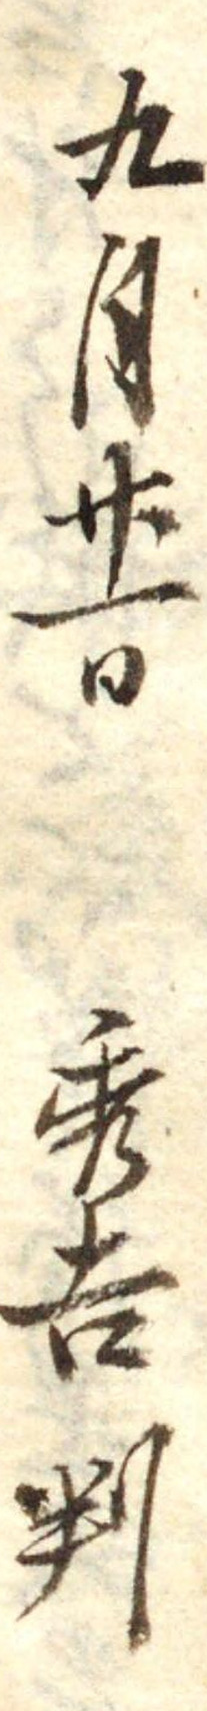九月廿一日秀吉判
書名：前田家封国証書集録
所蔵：Ishikawa Prefectural Library
